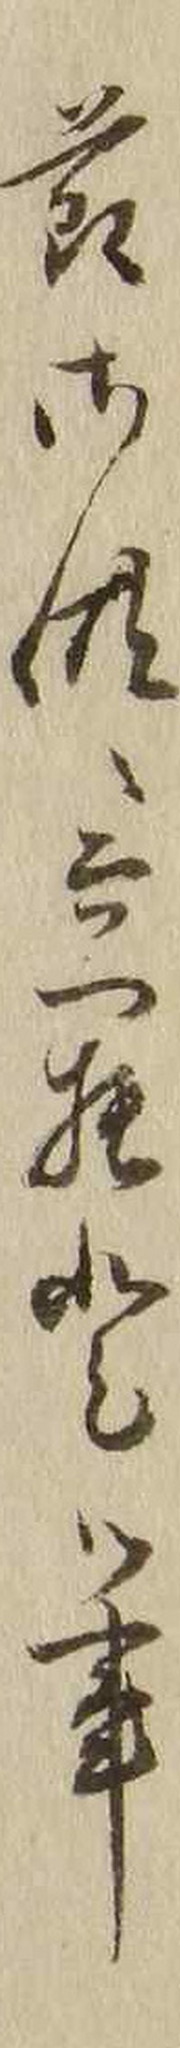節御供ニ而罷登候事
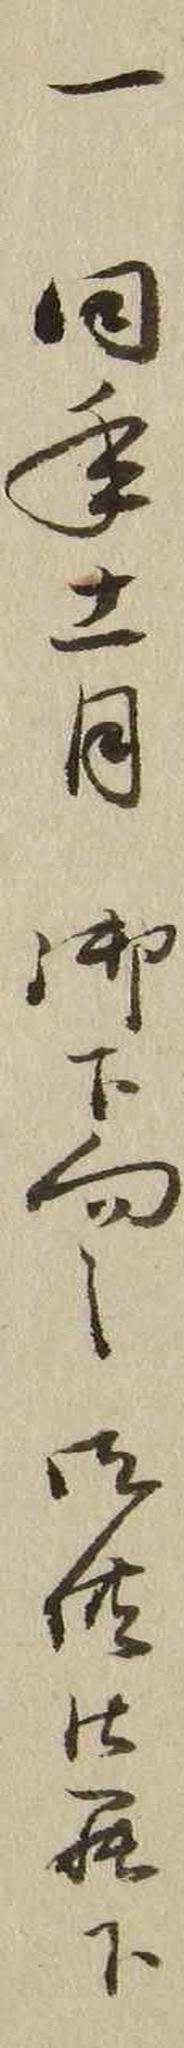一同年十一月御下向之御供仕罷下
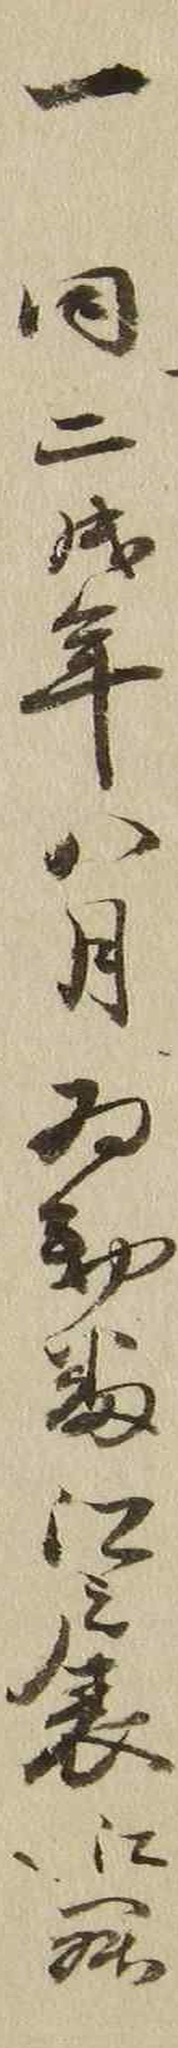一同二戌年八月為勤番江戸表江罷
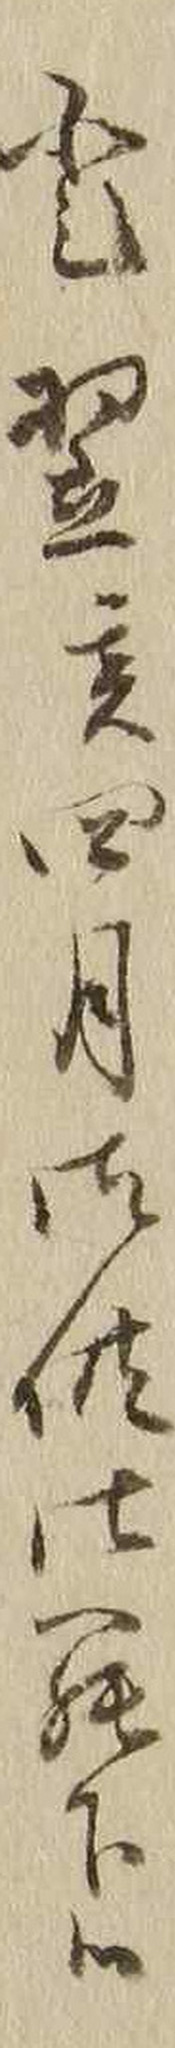登翌亥四月御供仕罷下候
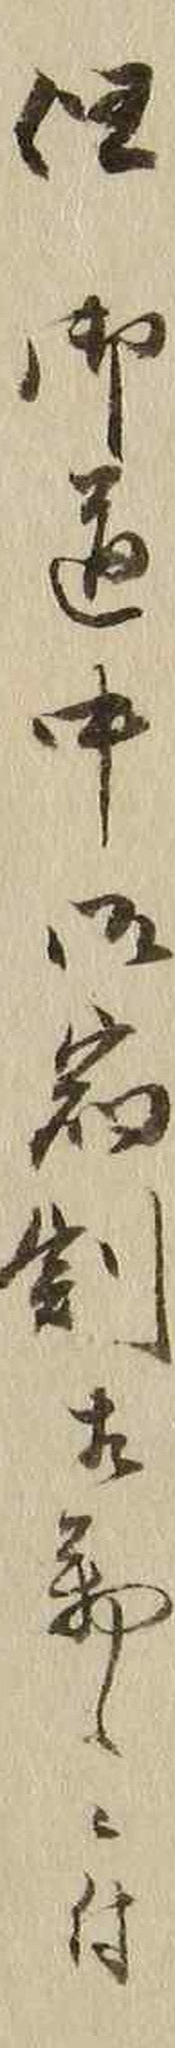但御道中御宿割相勤候ニ付
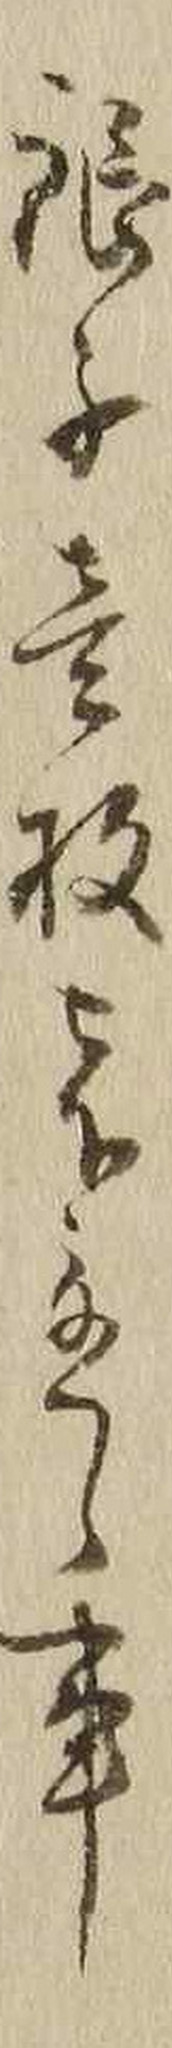銀子壱枚被下置候事
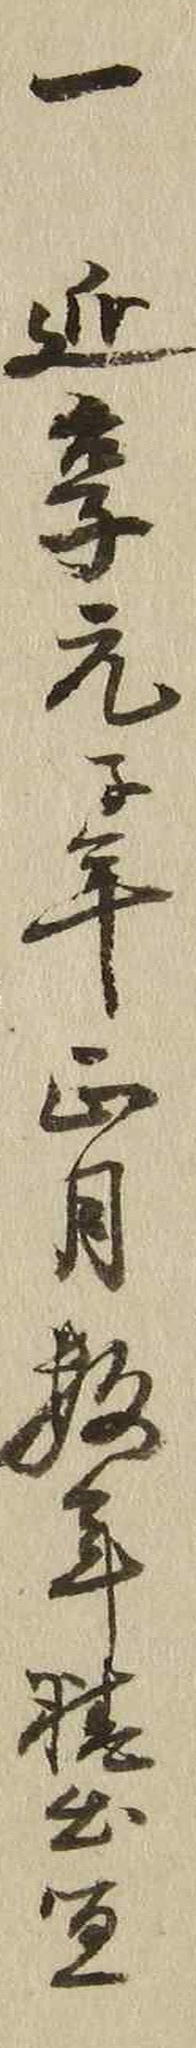一延享元子年正月数年精出宜
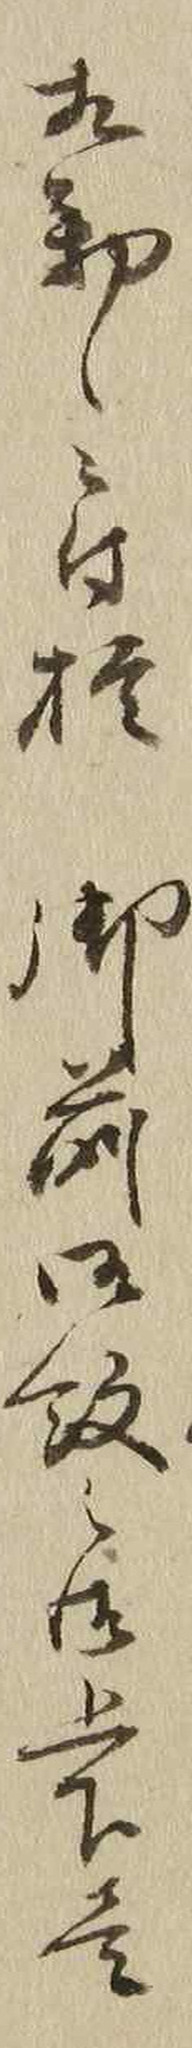相勤候ニ付於御前御紋之御上下壱
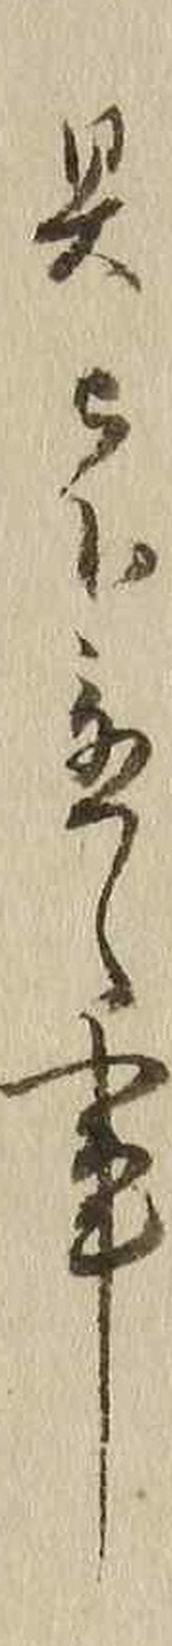具被下置候事
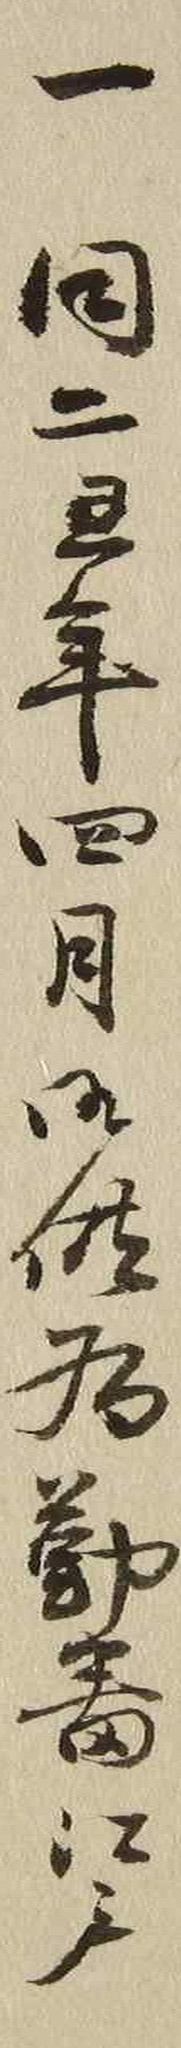一同二丑年四月御供為勤番江戸
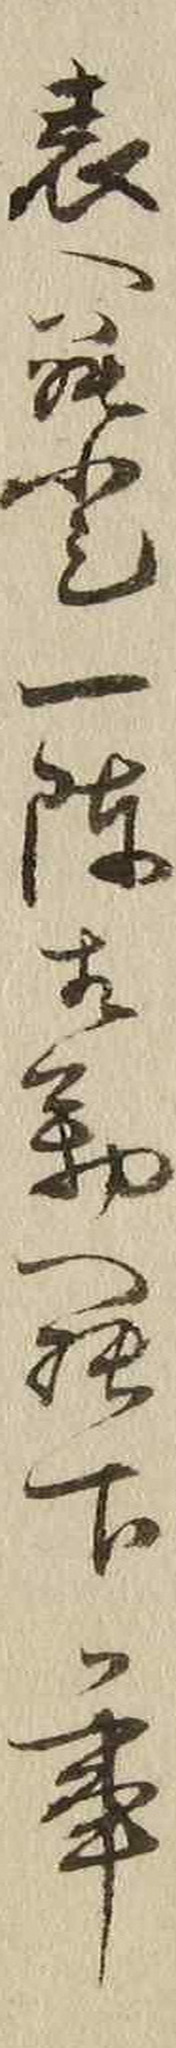表へ罷登一陣相勤罷下候事
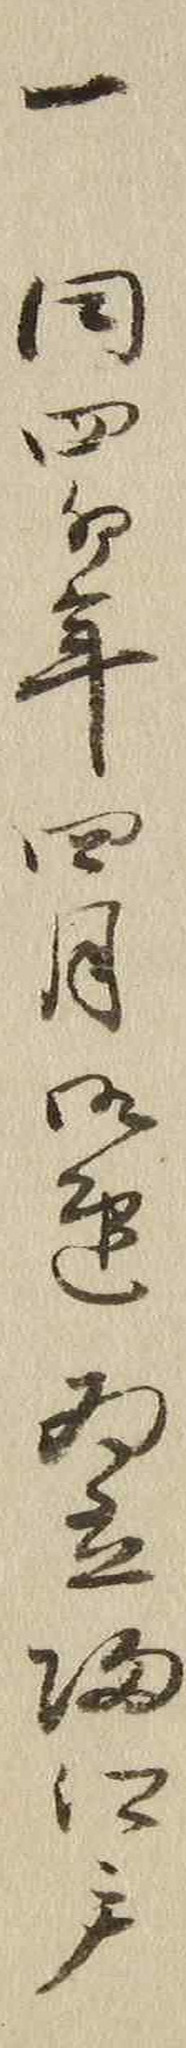一同四卯年四月御迎為立帰江戸
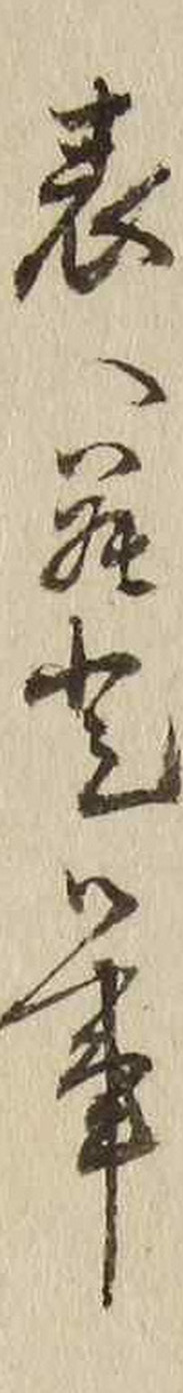表へ罷登候事
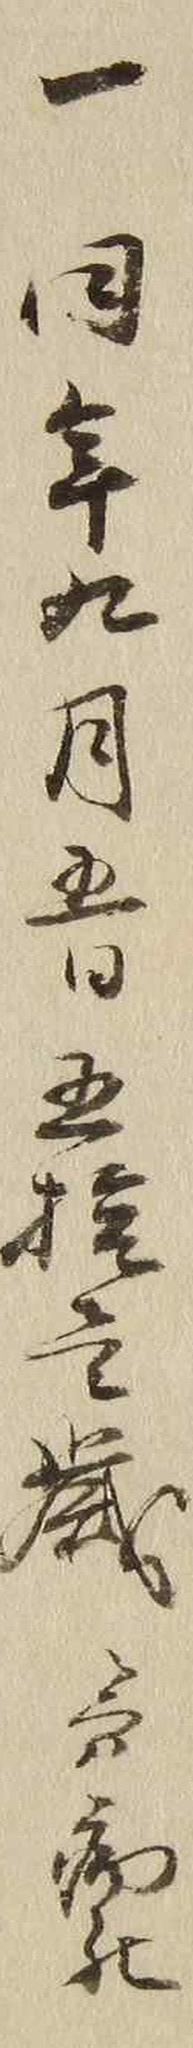一同年九月五日五拾壱歳ニ而病死
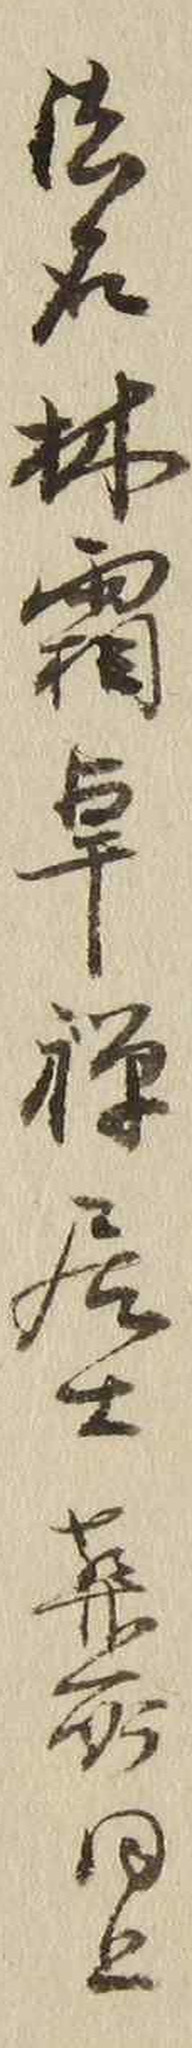法名林霜卓禅居士葬所同上
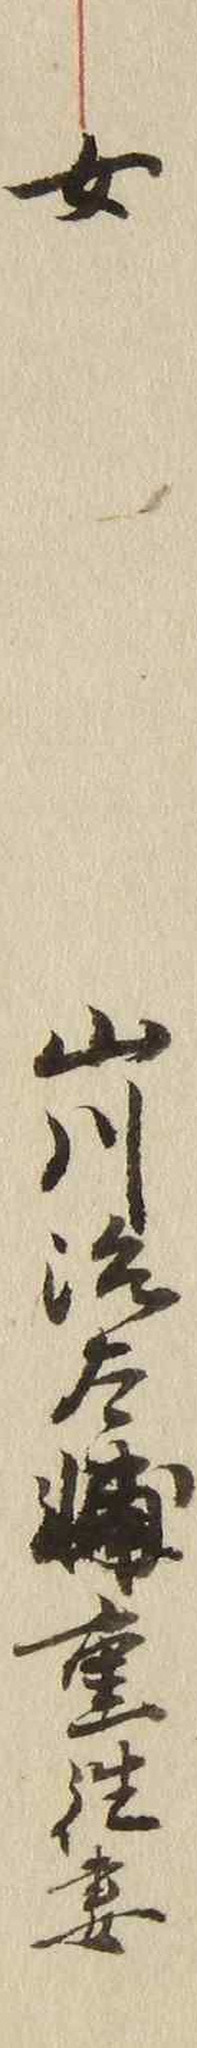女山川治太輔重往妻
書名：諸士系譜　巻之225　ま之部6
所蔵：会津若松市立会津図書館
